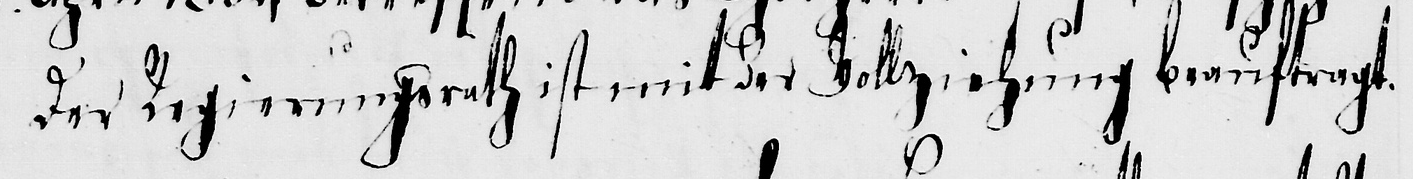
Der Regierungsrath ist mit der Vollziehung beauftragt.
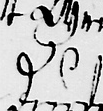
10.
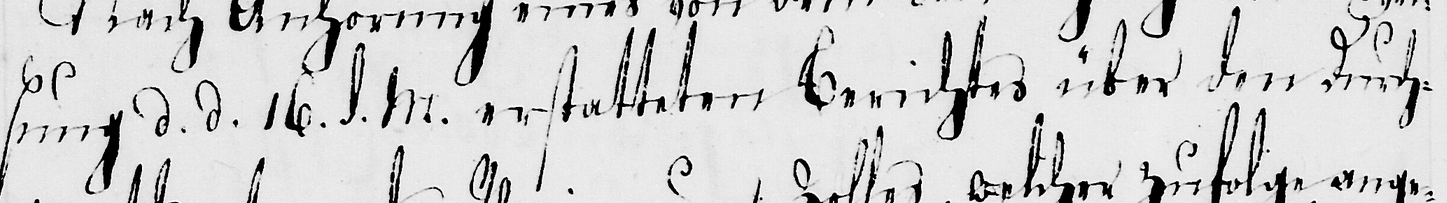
ung d. d. 16. d. M. erstatteten Berichtes über den Durch¬
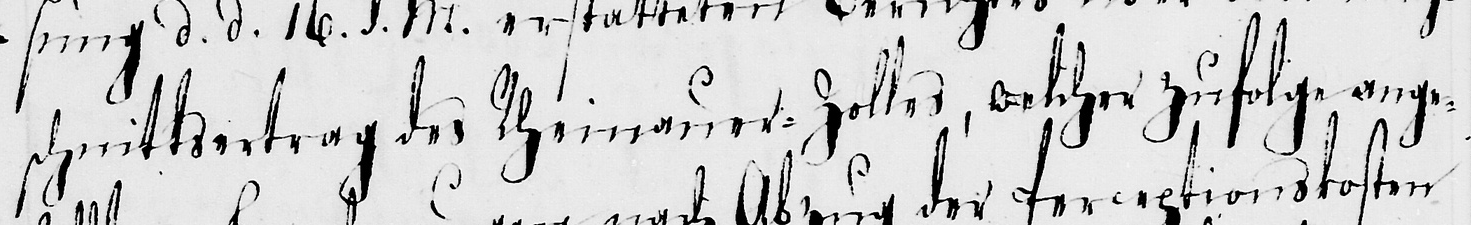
schnittsertrag des Rheinauer-Zolles, welcher zufolge ange¬
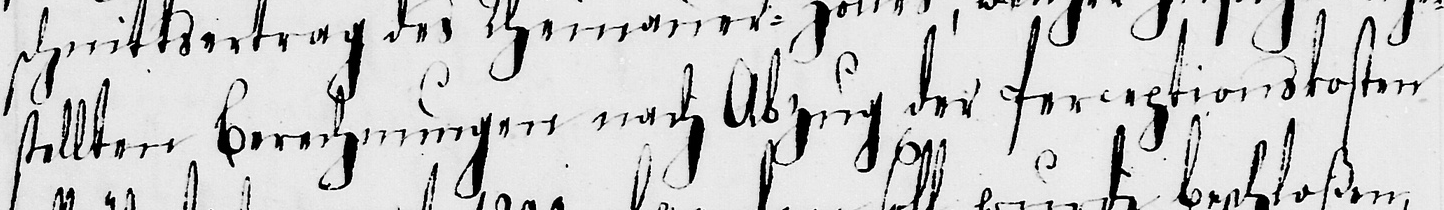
stellten Berechnungen nach Abzug der Perceptionskosten
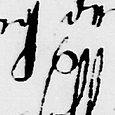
3. 4.
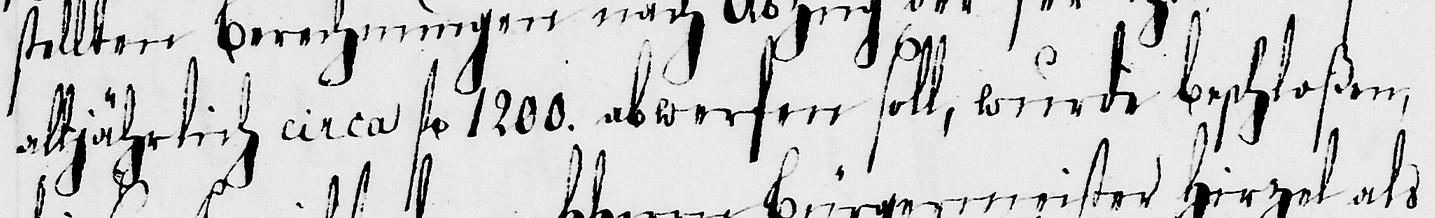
alljährlich circa fl. 1200. abwerfen soll, wurde beschloßen,
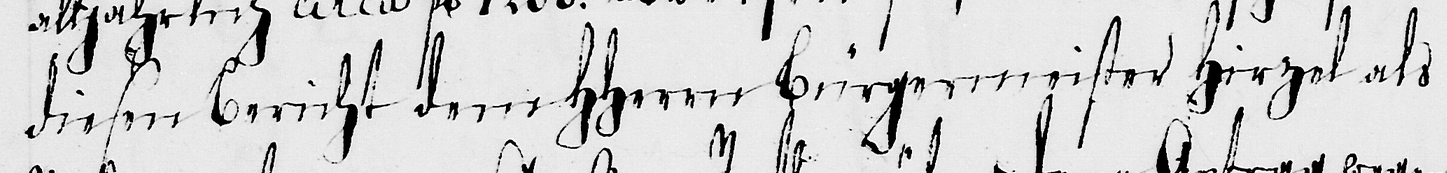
diesen Bericht dem HHerrn Bürgermeister Hirzel als
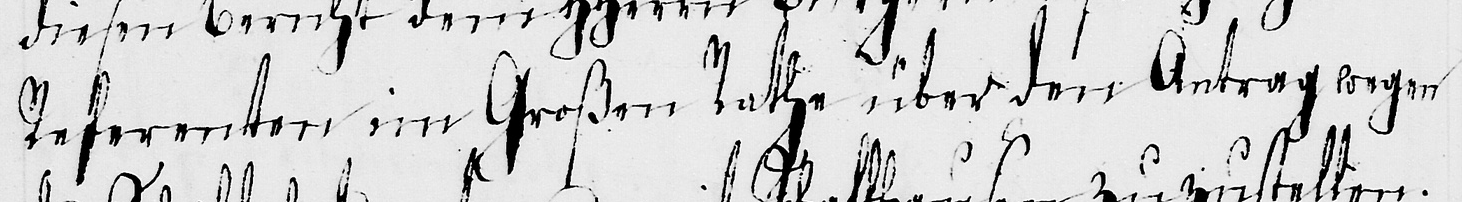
Referenten im Großen Rathe über den Antrag wegen
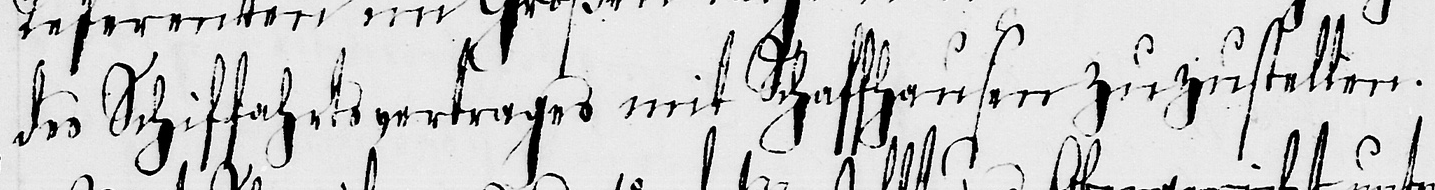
des Schiffahrtsvertrages mit Schaffhausen zuzustellen.
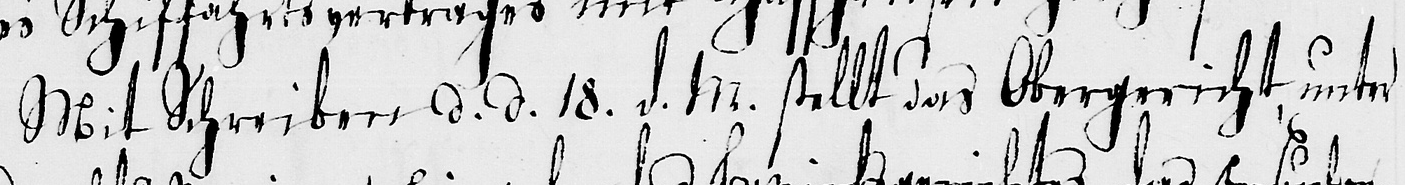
Mit Schreiben d. d. 18. d. M. stellt das Obergericht, unter
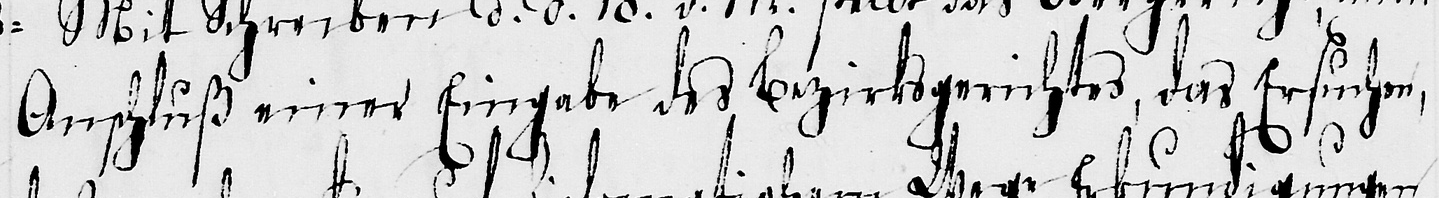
Anschluß einer Eingabe des Bezirksgerichtes, das Ersuchen,
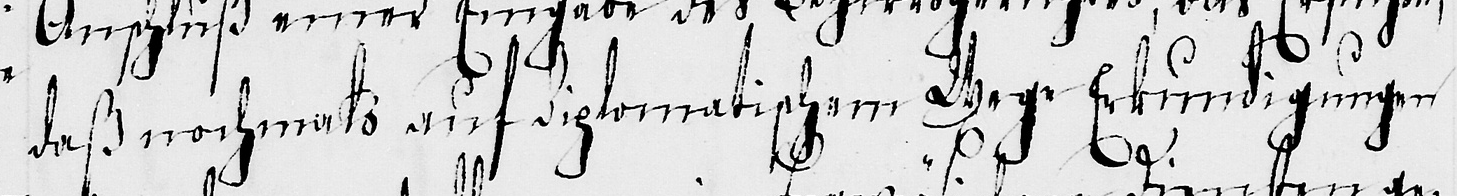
daß nochmals auf diplomatischem Wege Erkundigungen
